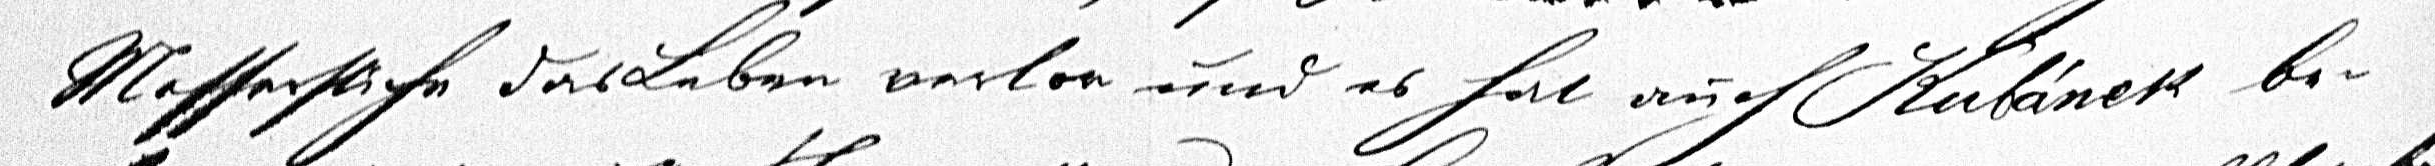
Messerstiche das Leben verlor und es hat auch Kubánek be¬
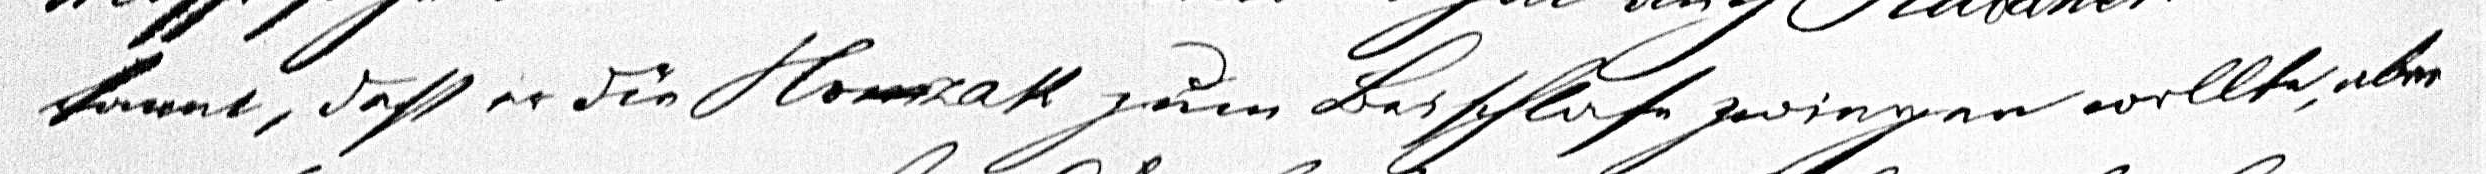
kannt, daß er die Hozak zum Beischlafe zwingen wollte, aber
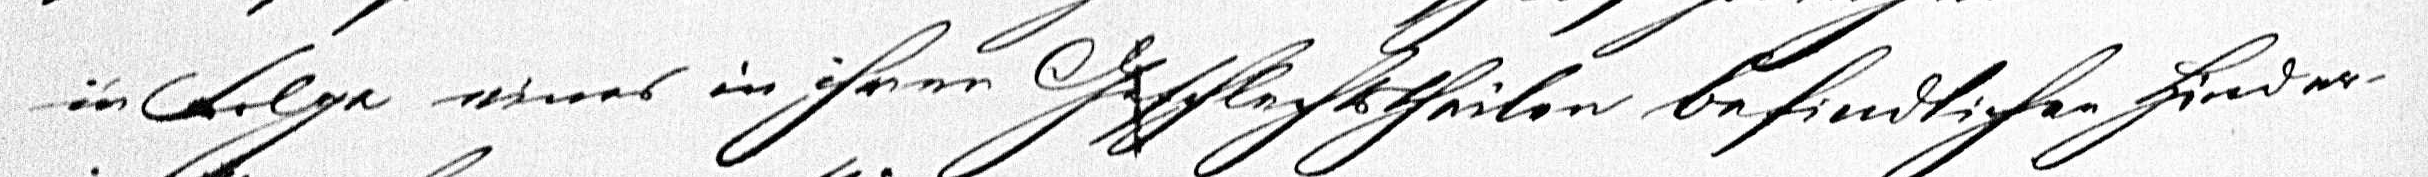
in Folge eines in ihrer Geschlechtstheilen befindlichen Hinder¬
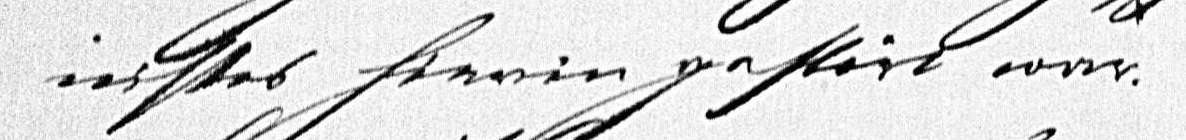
nißes hierin gestört war.
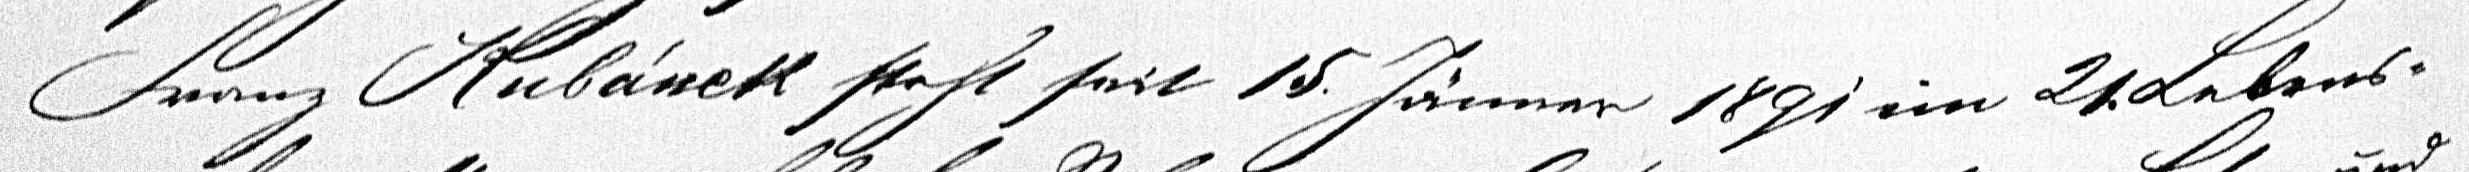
Franz Kubánek steht seit 15 Jänner 1891 im 21 Lebens¬
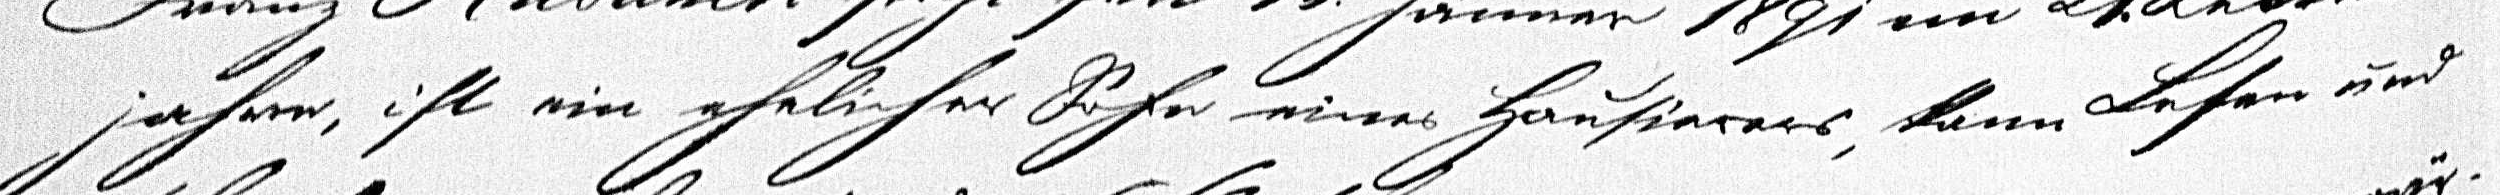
jahre, ist ein ehelicher Sohn eines Hausierers, kann Lesen und
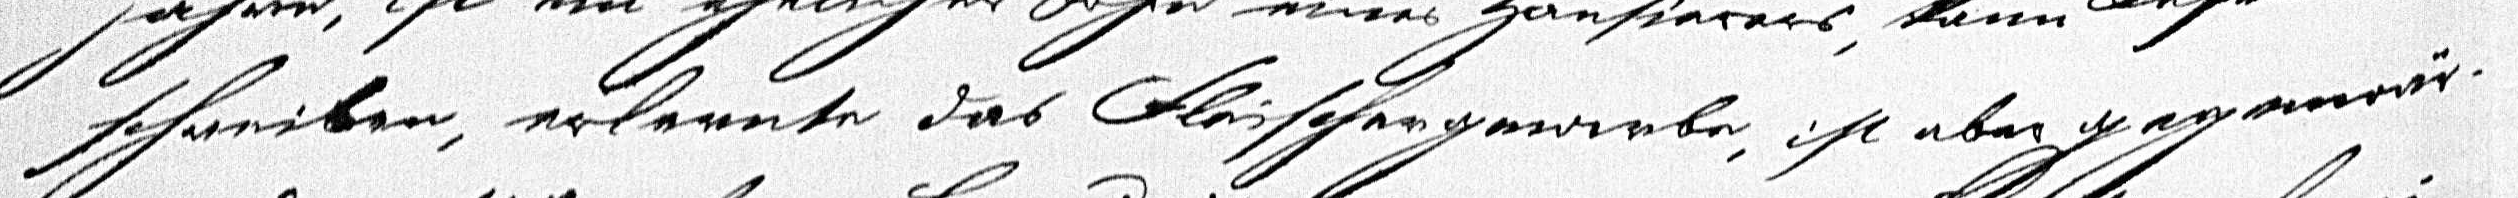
Schreiben, erlernte das Fleischergewerbe, ist aber gegenwär¬
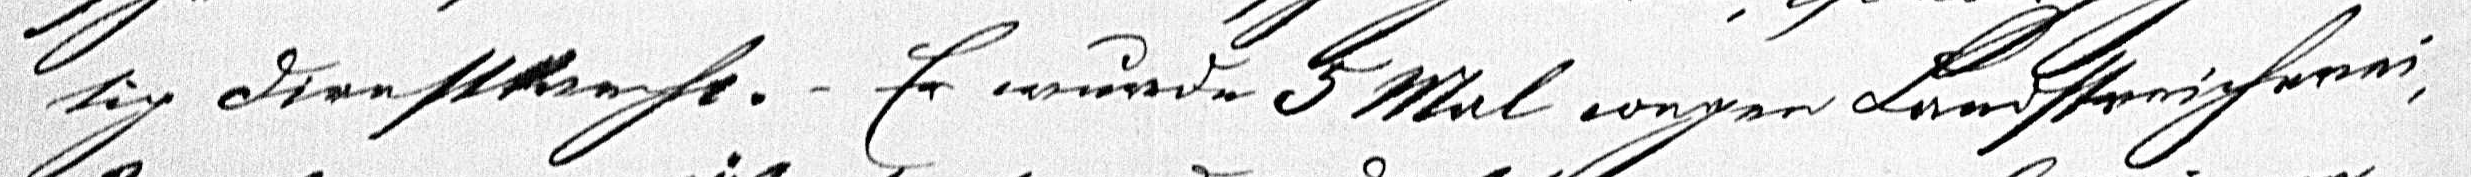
tig Dienstknecht. Er wurde 5 Mal wegen Landstreicherei,
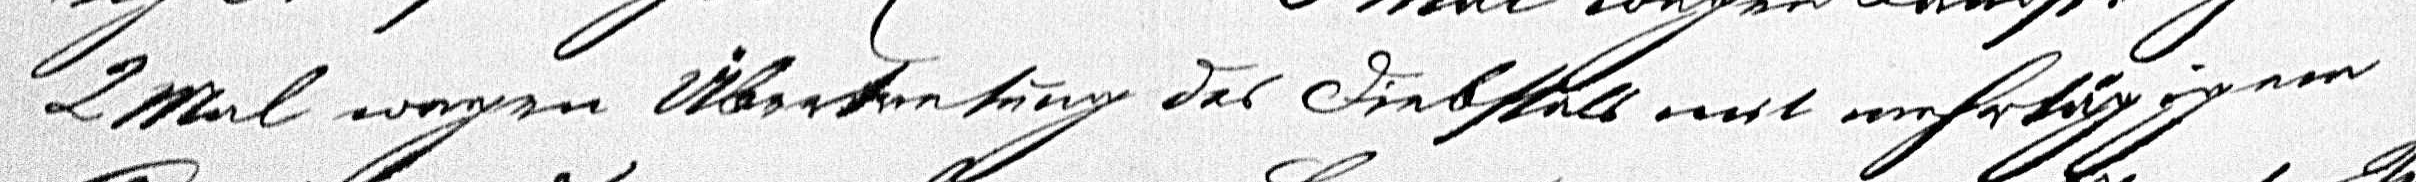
2 Mal wegen Übertretung der Diebstals mit mehrtägigen
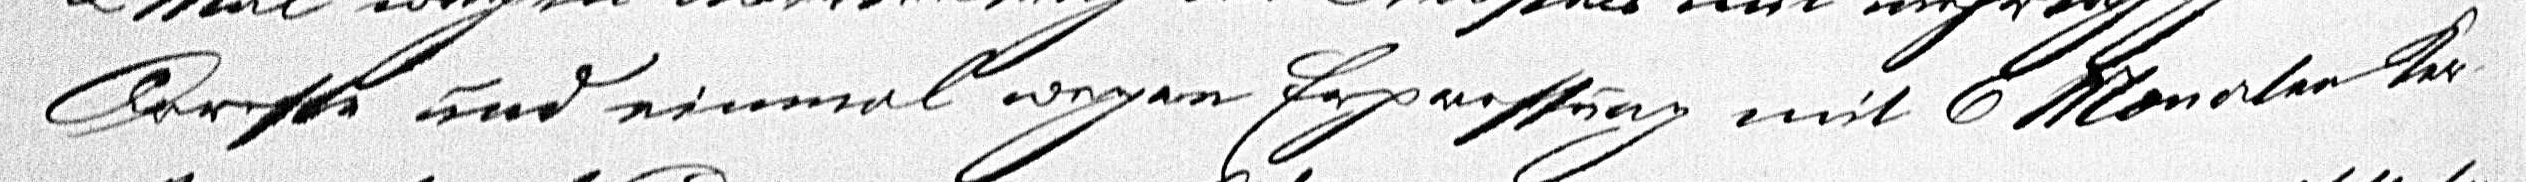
Arreste und einmal wegen Erpressung mit 6 Monaten Ker¬
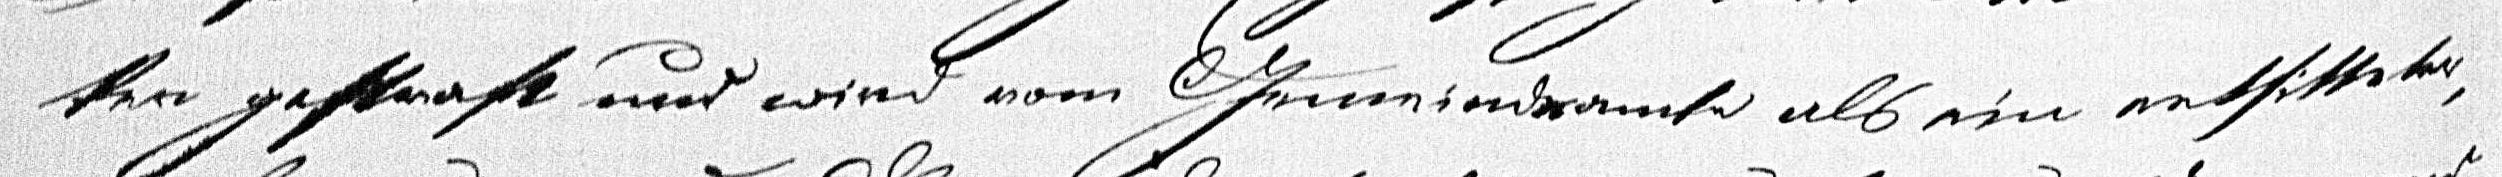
ker gestraft und wird vom Gemeindeamte als ein entsitteter,
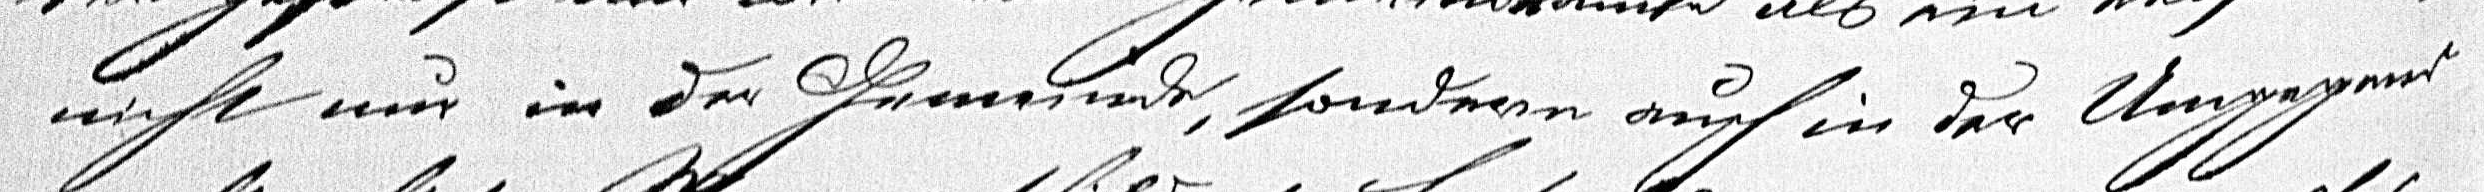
nicht nur in der Gemeinde, sondern auch in der Umgegend
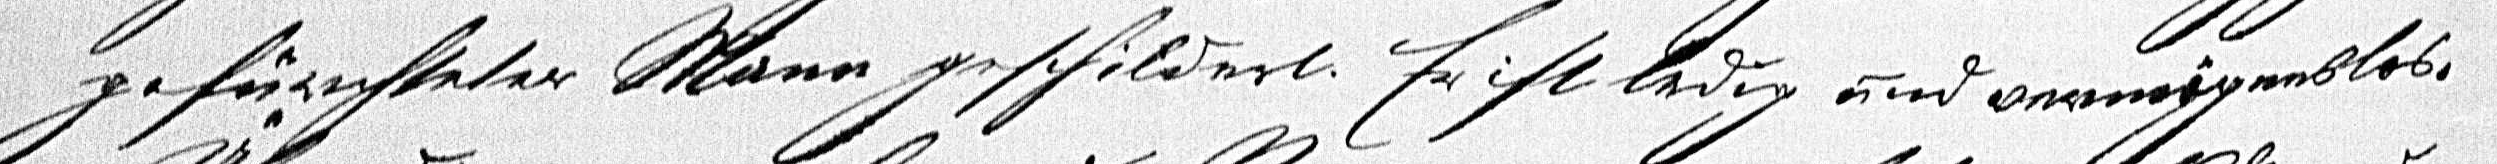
gefürhcteter Mann geschildert. Er ist ledig und vermögenslos.
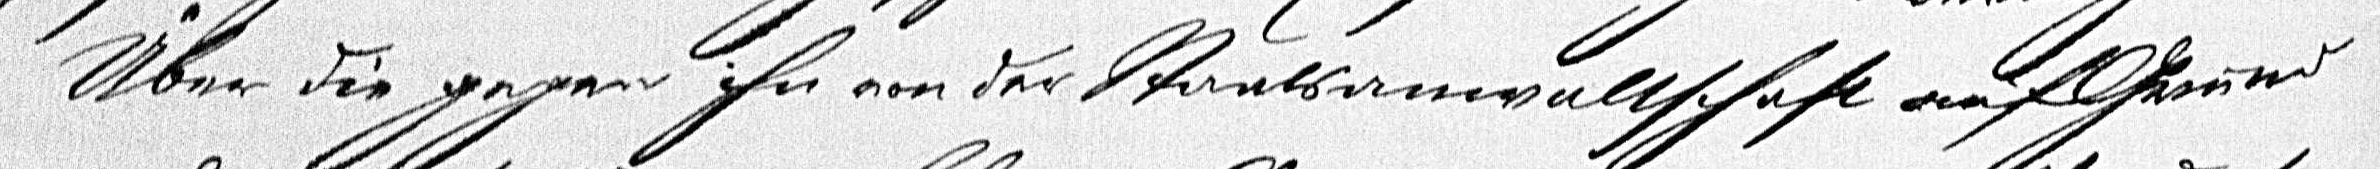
Über die gegen ihn von der Staatsanwaltschaft auf Grund
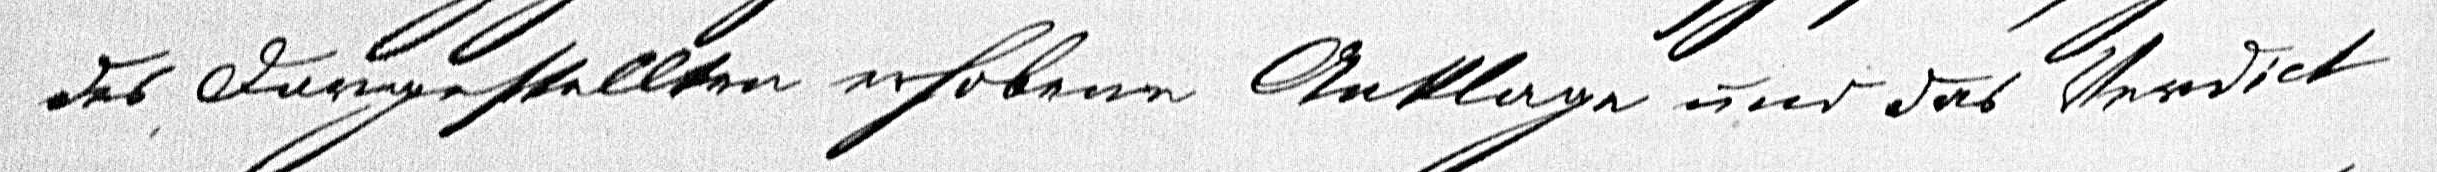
des dargestellten erhobene Anklage und des Verdict
